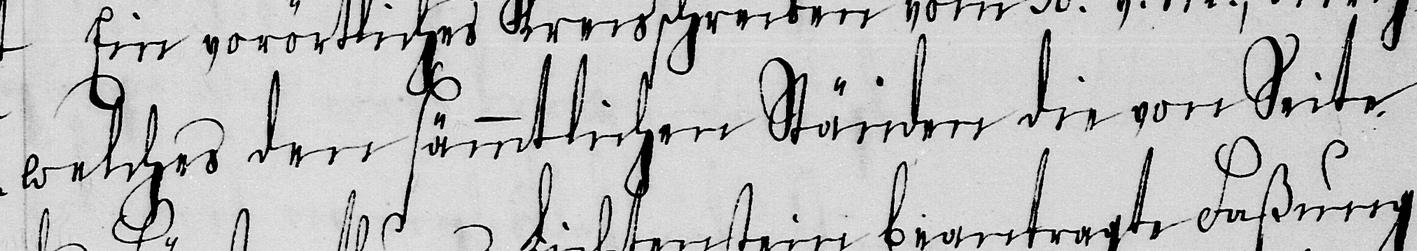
welches den sämmtlichen Ständen die von Seite
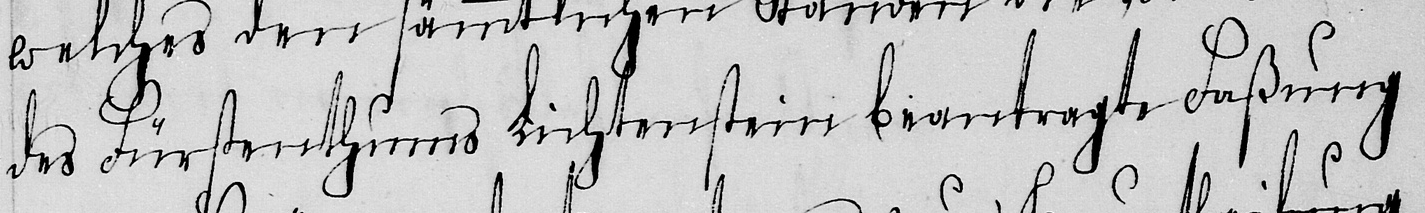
des Fürstenthums Lichtenstein beantragte Faßung
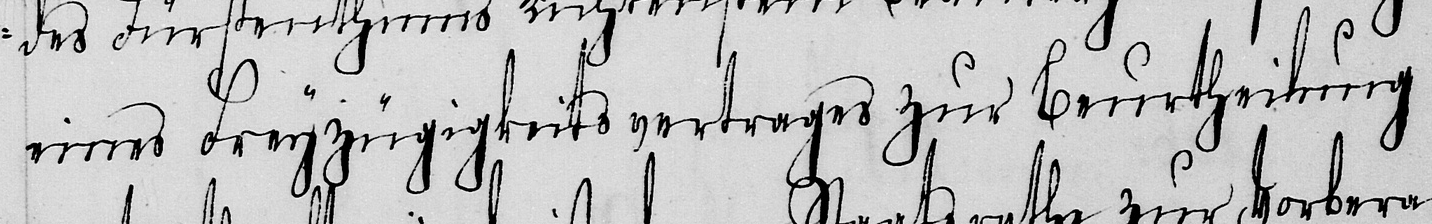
eines Freyzügigkeitsvertrages zur Beurtheilung
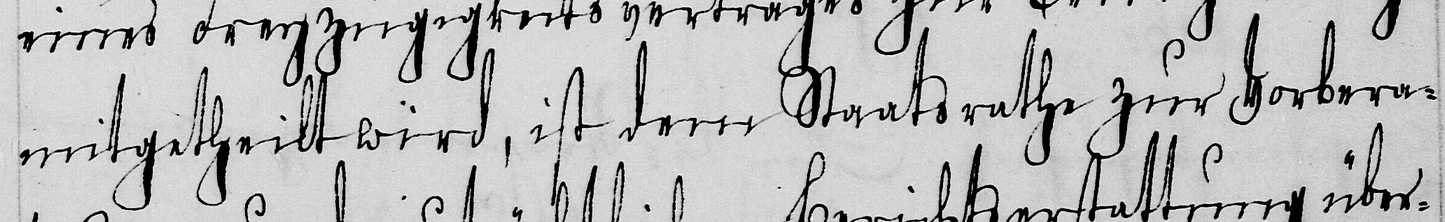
mitgetheilt wird, ist dem Staatsrathe zur Vorbera¬
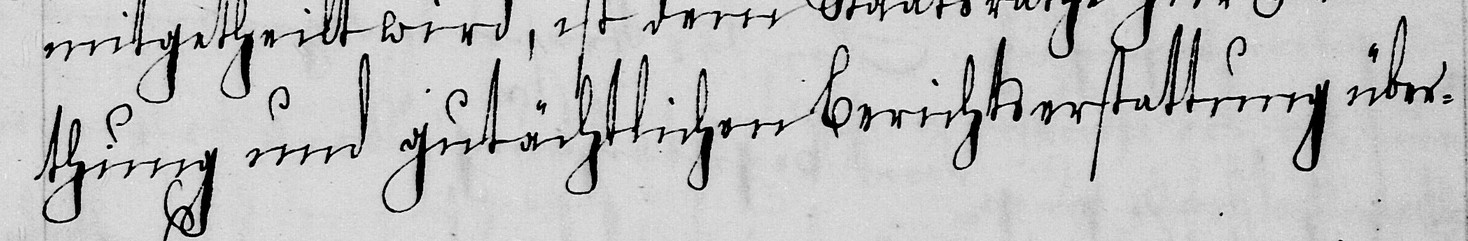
thung und gutächtlichen Berichtserstattung über¬
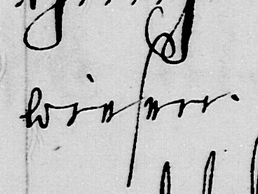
Weisun¬
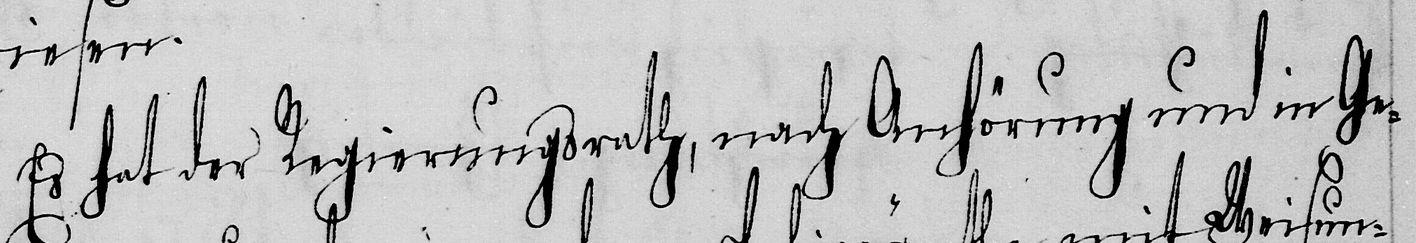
s hat der Regierungsrath, nach Anhörung und in Ge¬
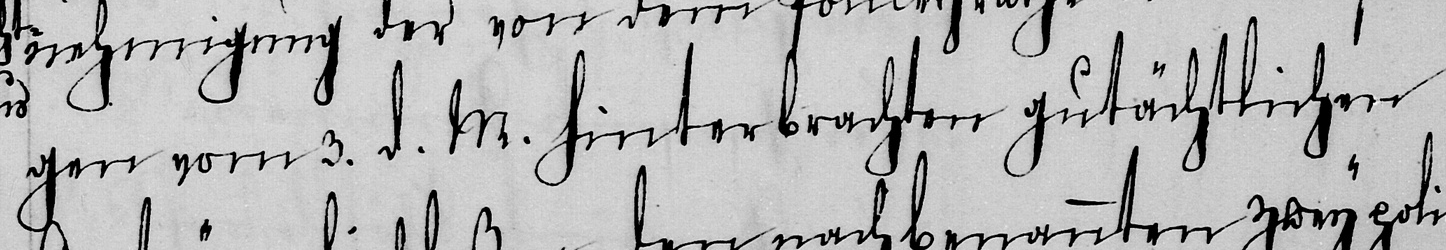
gen vom 3. d. M. hinterbrachten gutächtlichen
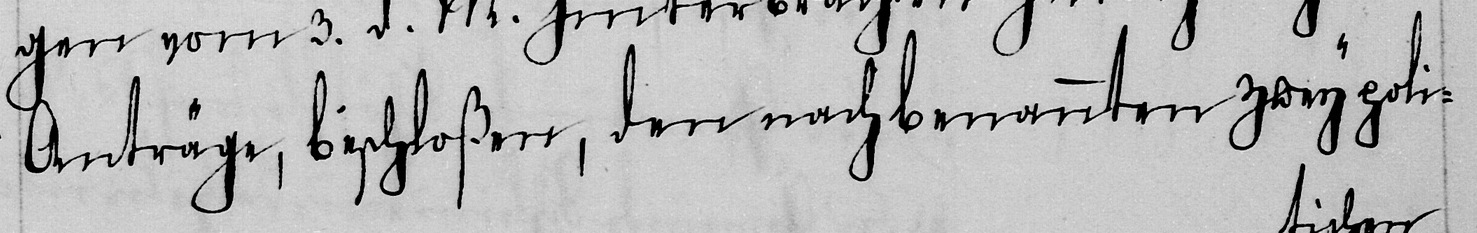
Anträge, beschloßen, den nachbenannten zwey poli-
